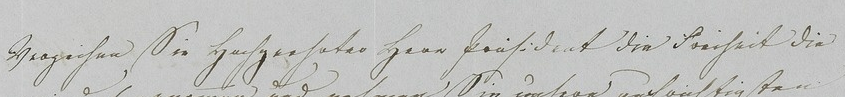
Verzeihen Sie Hochgeehrter Herr Präsident die Freiheit die
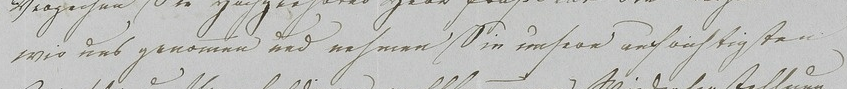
wir uns genommen und nehmen Sie unsere aufrichtigsten
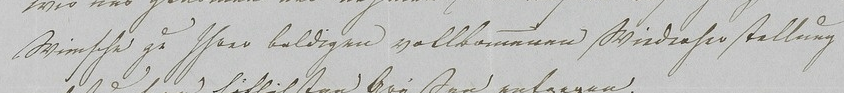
Wünsche zu Ihrer baldigen vollkommenen Wiederherstellung
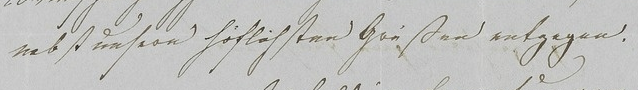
nebst unsern höflichsten Grüßen entgegen.
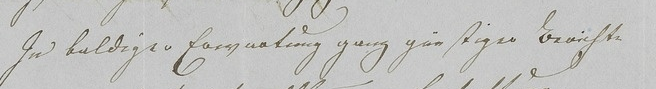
In baldiger Erwartung ganz günstiger Berichte
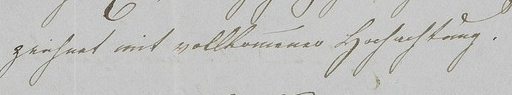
zeichnet mit vollkommener Hochachtung
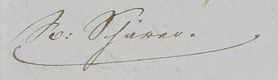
R: Schärer.
